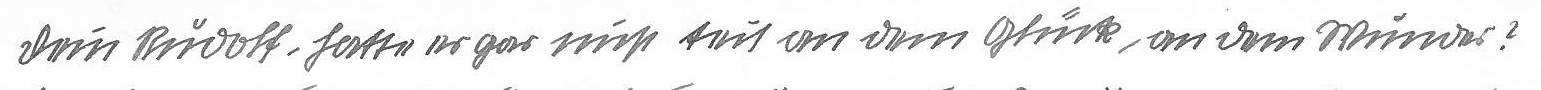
Dein , hatte er gar nicht teil an dem Glück, an dem Wunder?
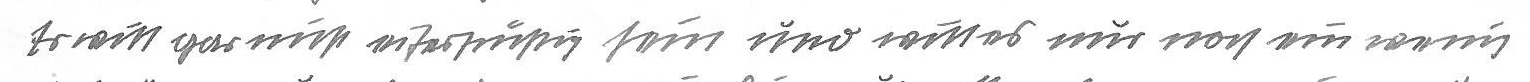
Er will gar nicht eifersüchtig sein und will es nur noch ein wenig
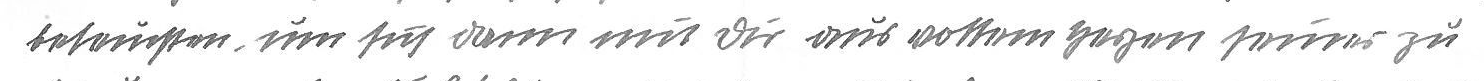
beleuchten, um sich dann mit Dir aus vollem Herzen seiner zu
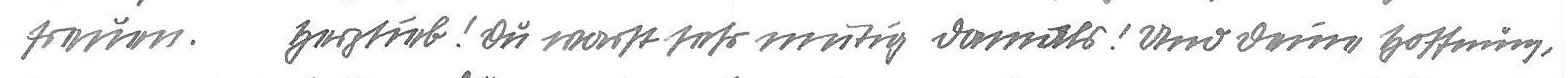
freuen. Herzlieb! Du warst sehr mutig damals! Und Deine Hoffnung,
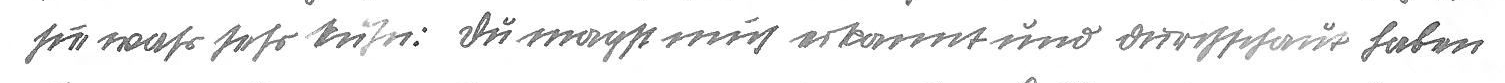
sie wahr sehr kühn: Du magst mich erkannt und durchschaut haben
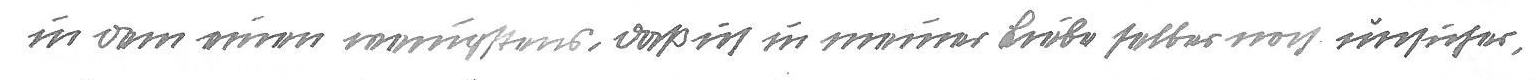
in dem einen wenigstens, daß ich in meiner Liebe selber noch unsicher,
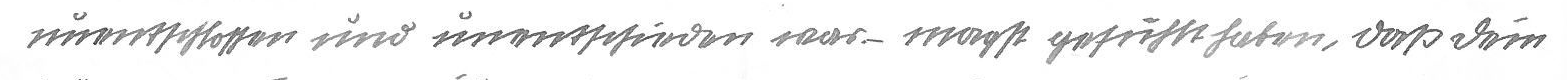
unentschlossen und unentschieden war – magst gefühlt haben, daß Dein
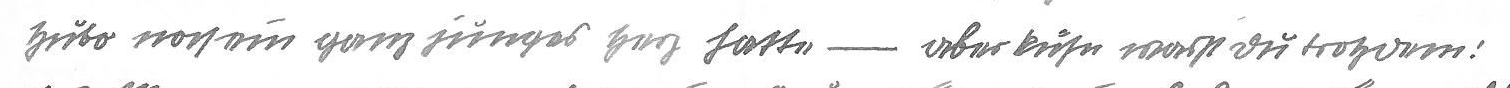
Hubo noch ein ganz junges Herz hatte – aber kühn warst Du trotzdem:
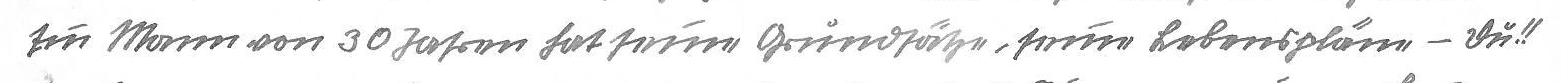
Ein Mann von 30 Jahren hat seine Grundsätze, seine Lebenspläne – Du!!
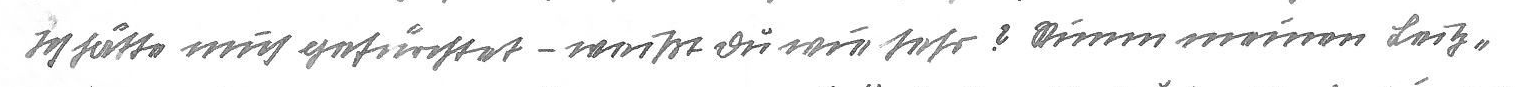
Ich hätte mich gefürchtet – weißt Du wie sehr? Nimm meinen Leitz¬
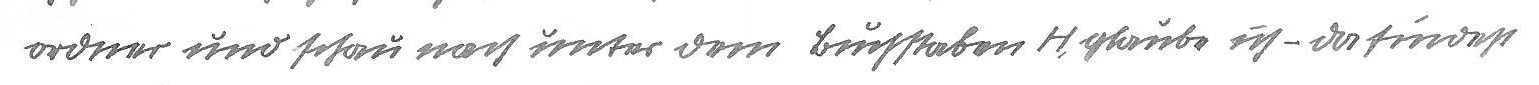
ordner und schau nach unter dem Buchstaben H, glaube ich – da findest
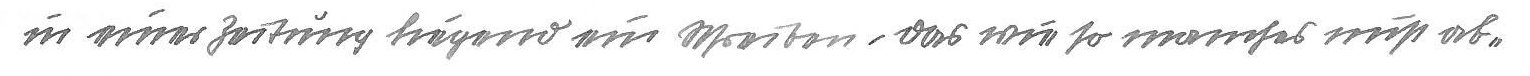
in einer Zeitung liegend ein Schreiben, das wie so manches nicht ab¬
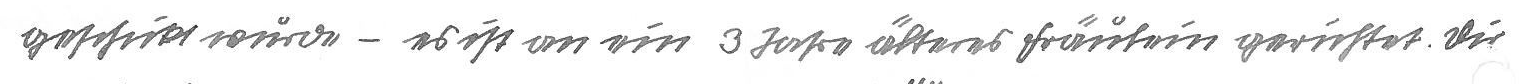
geschickt wurde – es ist an ein 3 Jahre älteres Fräulein gerichtet. Dir
